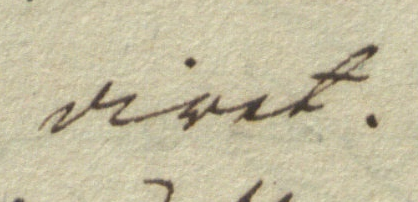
viret.
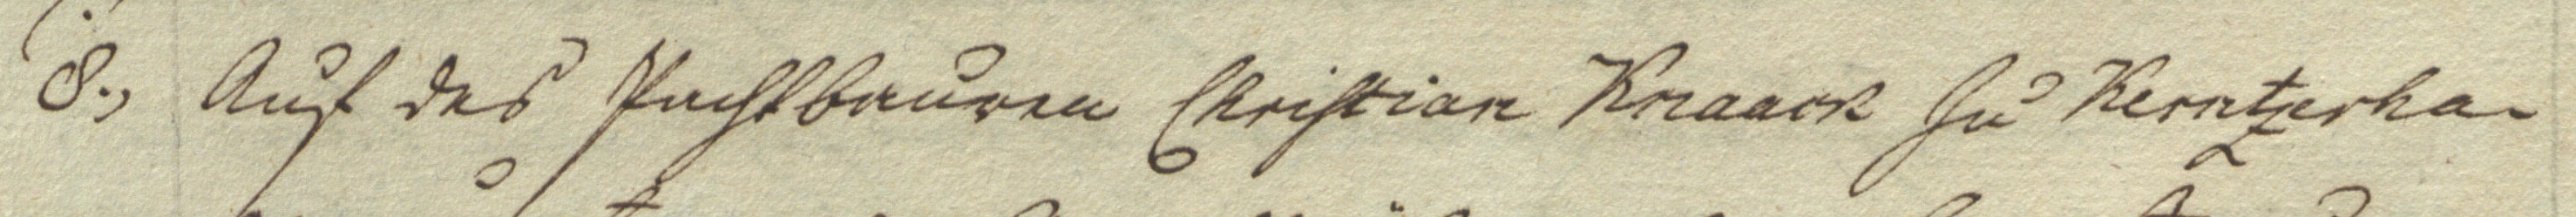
8., Auf des Pachtbauren Christian Knaack zu Kemtzerha-
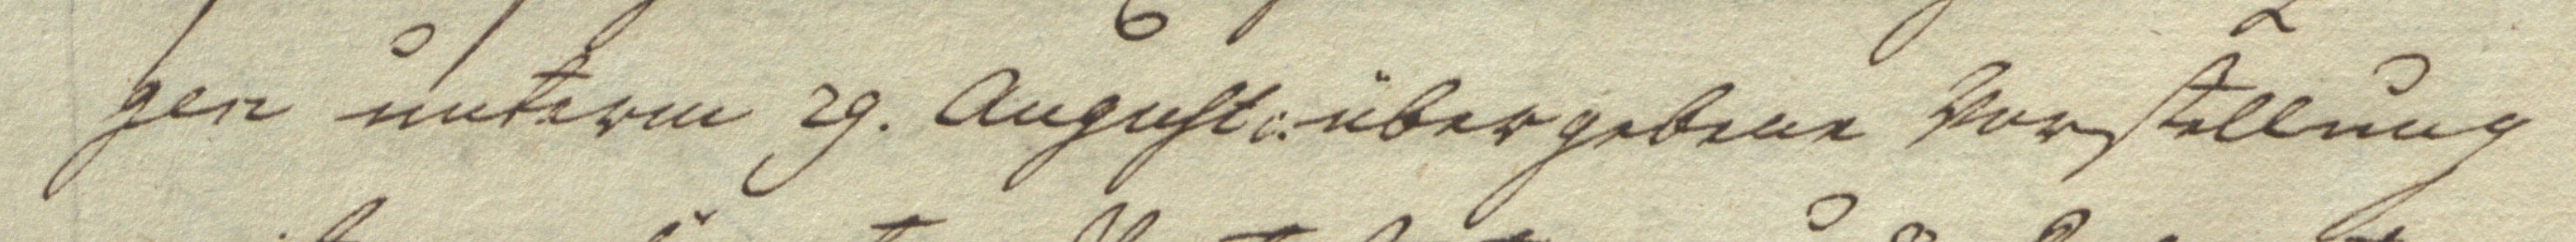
gen unterm 29. August c. übergebene Vorstellung
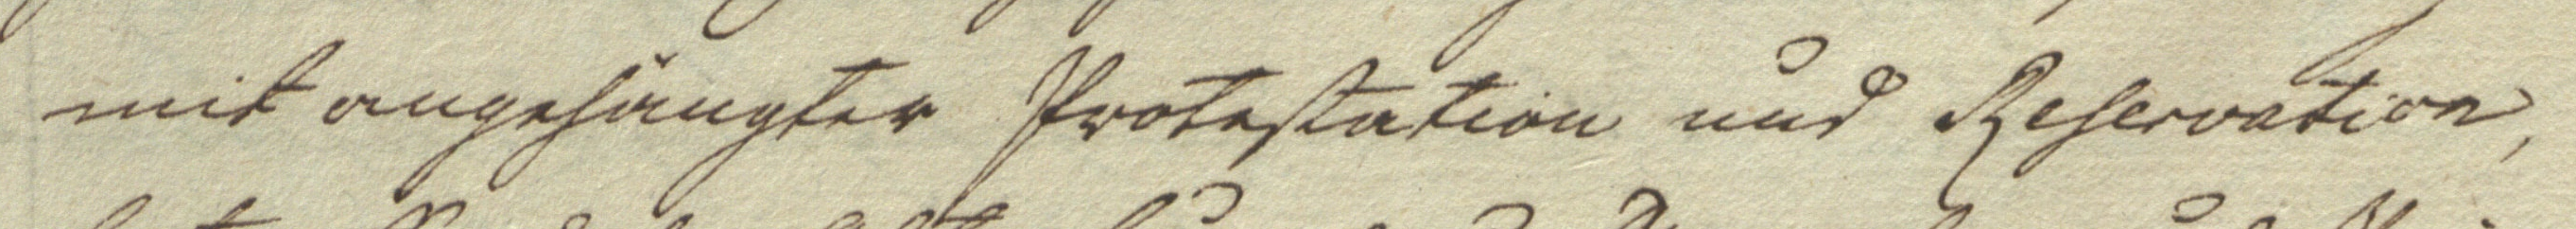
mit angehängter Protestation und Reservation,
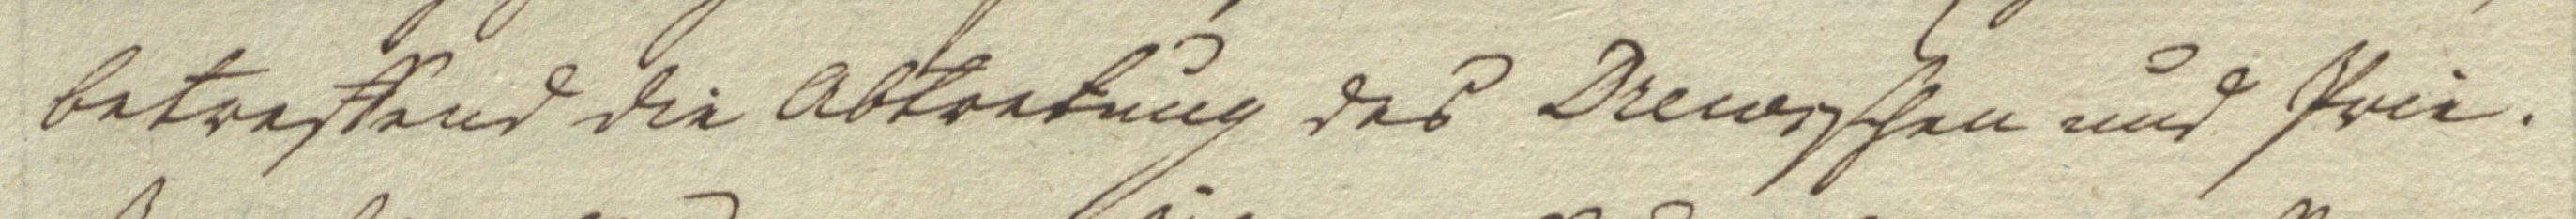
betreffend die Abtretung des Drewsschen und Prie¬
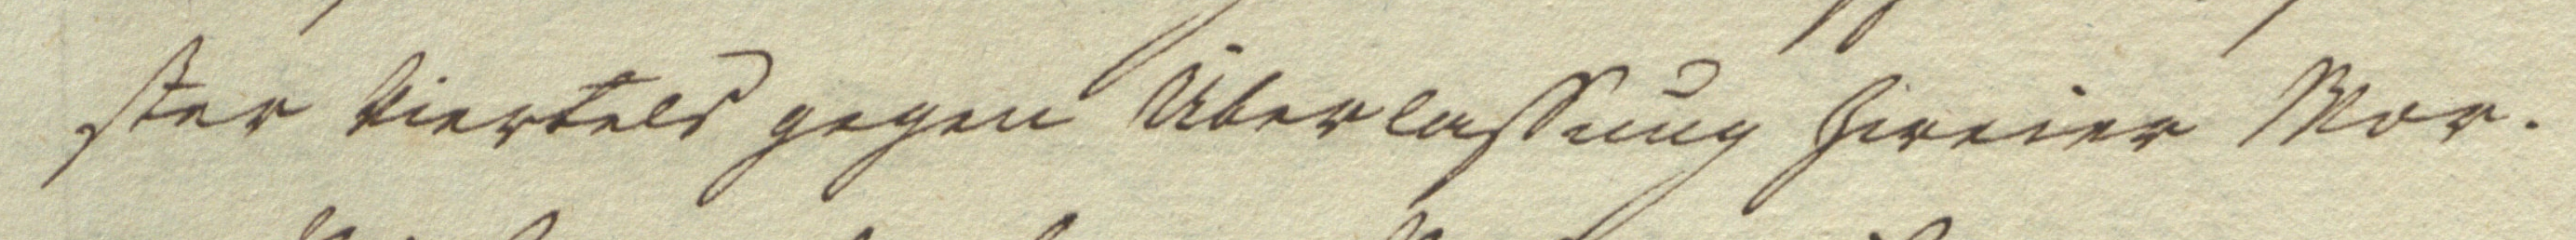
ster Viertels gegen Überlassung zweier Mor¬
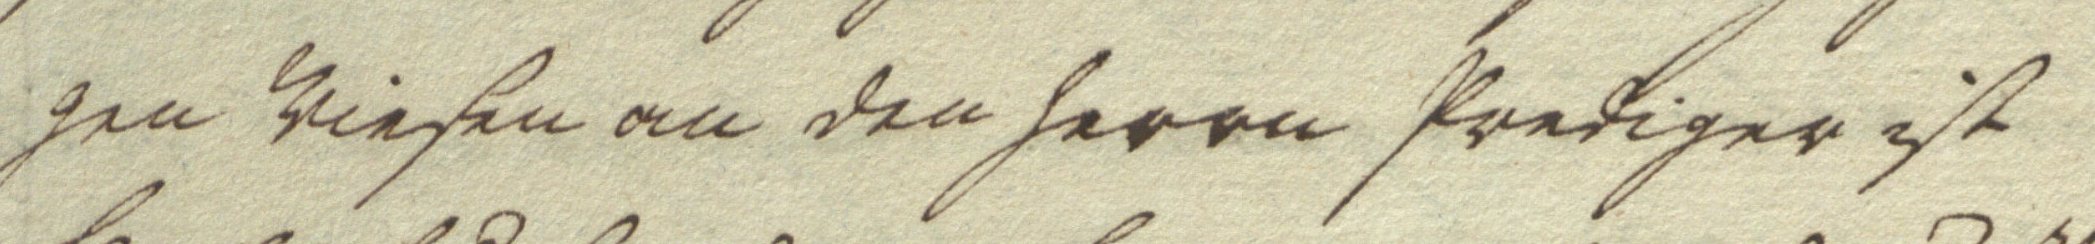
gen Wiesen an den Herrn Prediger ist
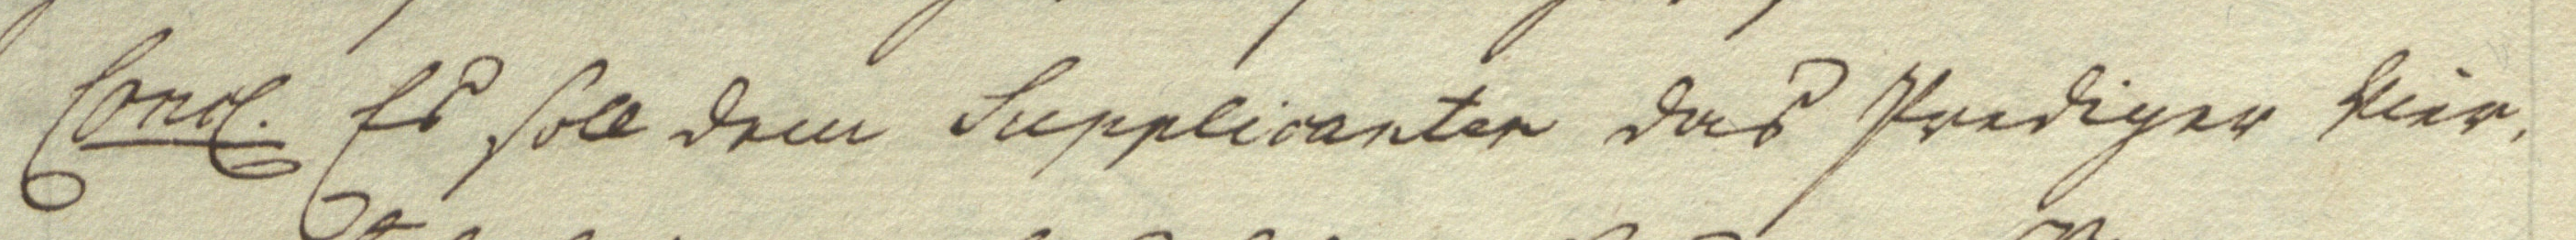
Concl. Es soll dem Supplicanten das Prediger Vier¬
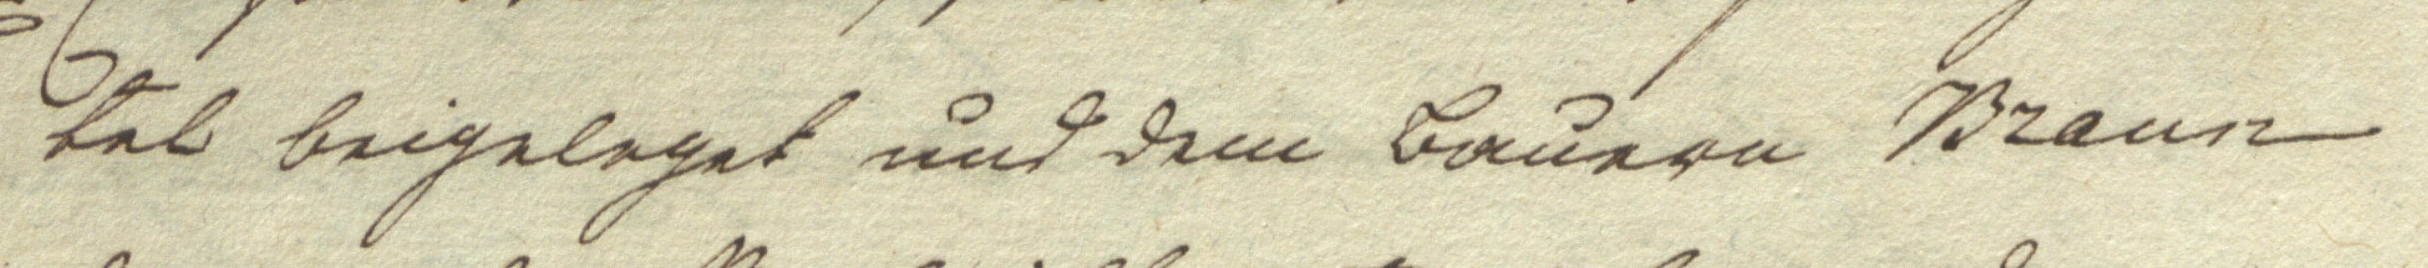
tel beigeleget und dem Bauern Braun
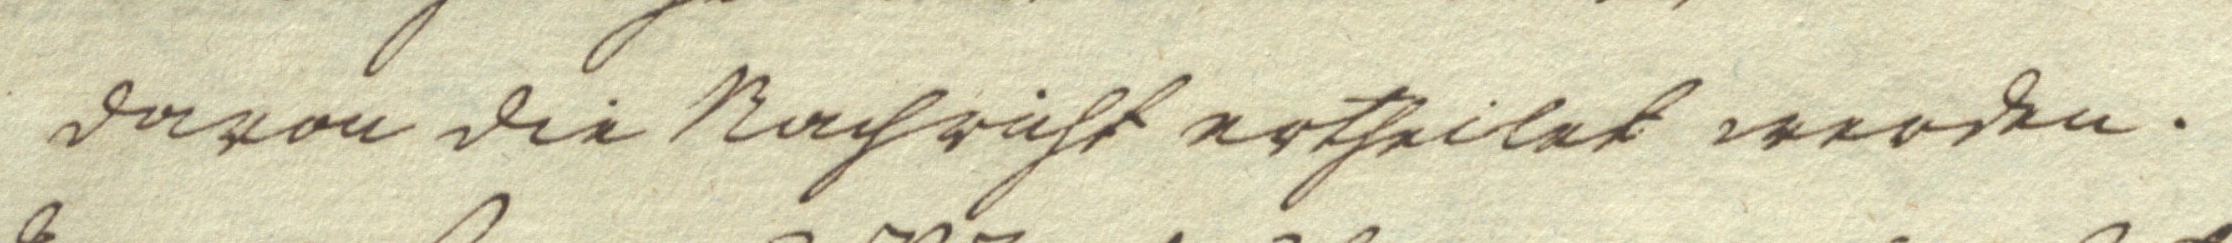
davon die Nachricht ertheilet werden.
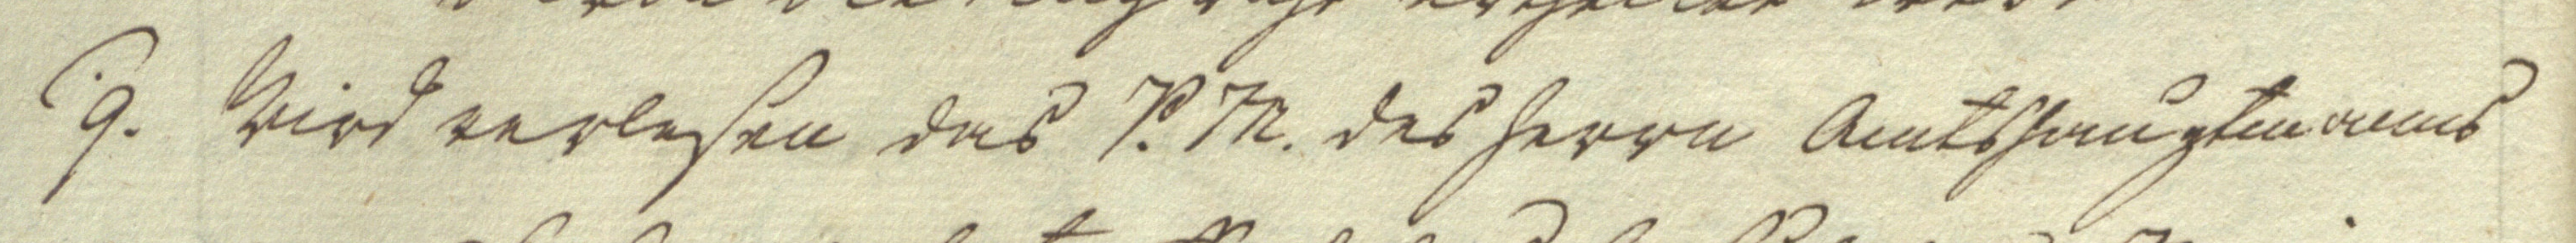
9. Wird verlesen das P. M. des Herrn Amtshauptmanns
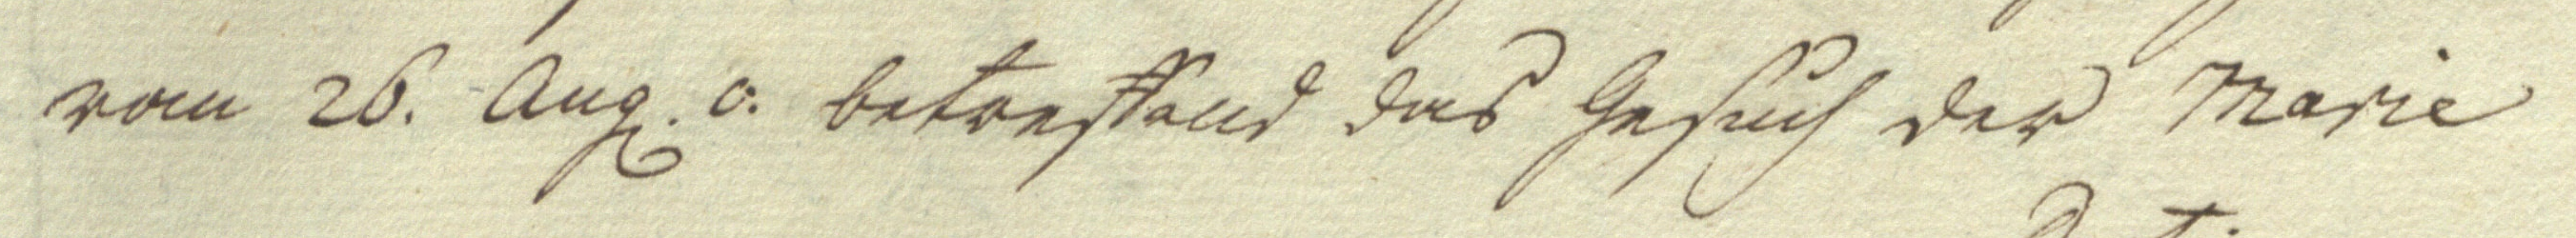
vom 26. Aug. c. betreffend das Gesuch der Marie
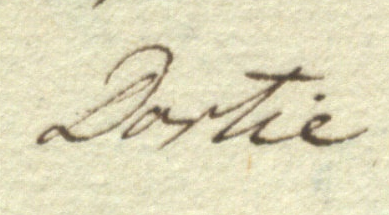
Dortie
